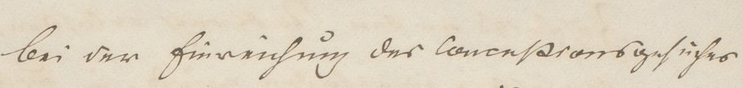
bei der Einreichung des Conceßionsgesuches
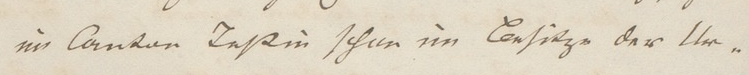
im Canton Teßin schon im Besitze der Ur-
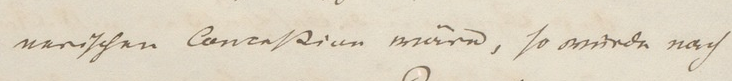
nerischen Conceßion wäre, so würde nach
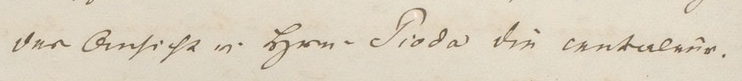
der Ansicht v. Hrn. Pioda die centraleur.
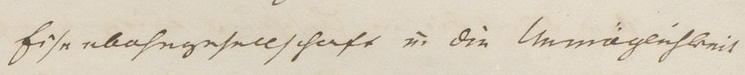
Eisenbahngesellschaft in die Unmöglichkeit
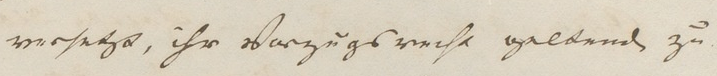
versetzt, ihr Vorzugsrecht geltend zu
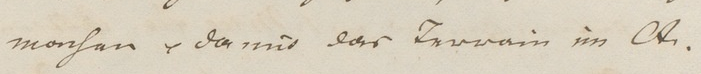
machen & damit das Terrain im Ct.
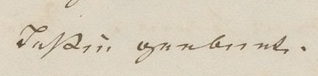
Teßin geebnet. –
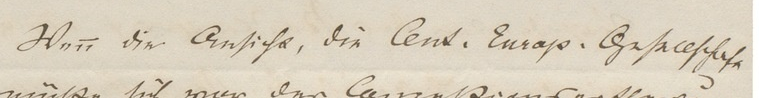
Wenn die Ansicht, die Cent. Europ. Gesellschaft
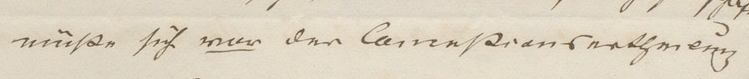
müße sich vor der Conceßionsertheilung
